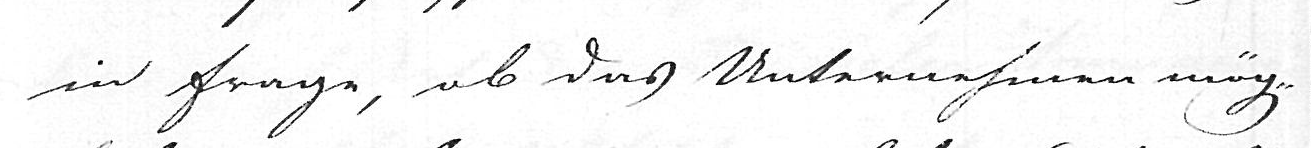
in Frage, ob das Unternehmen mög-
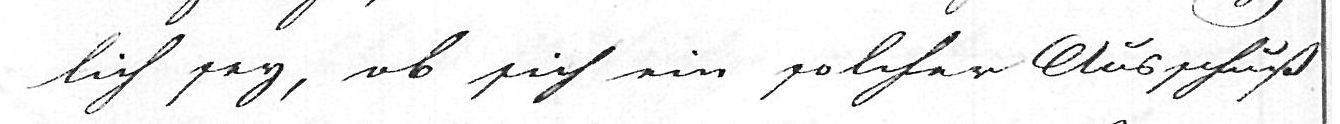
lich sey, ob sich ein solcher Ausschuß
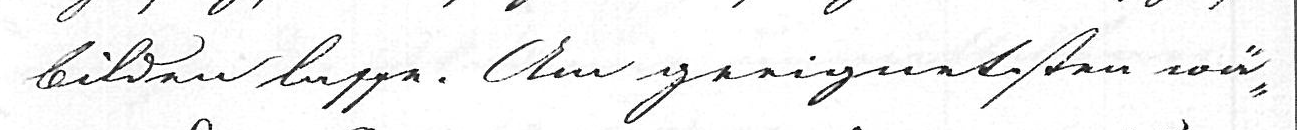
bilden lasse. An geeignetsten wä-
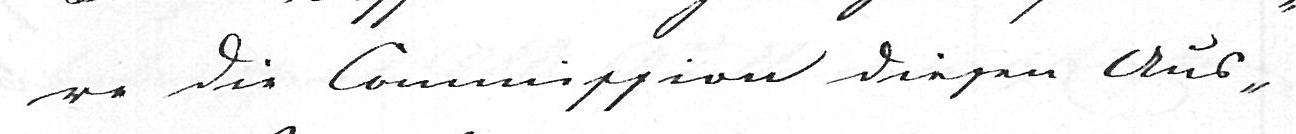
re die Commission diesen Aus-
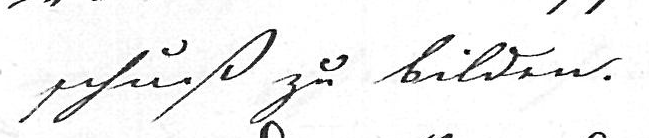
schluß zu bilden.
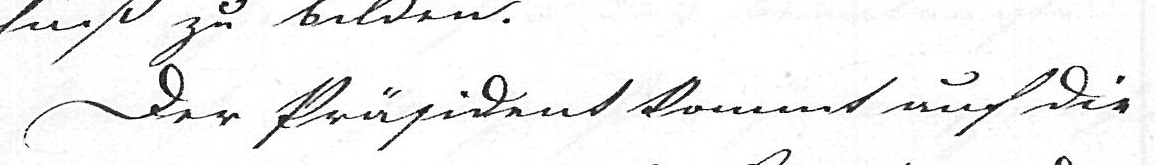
Der Präsident kommt auf die
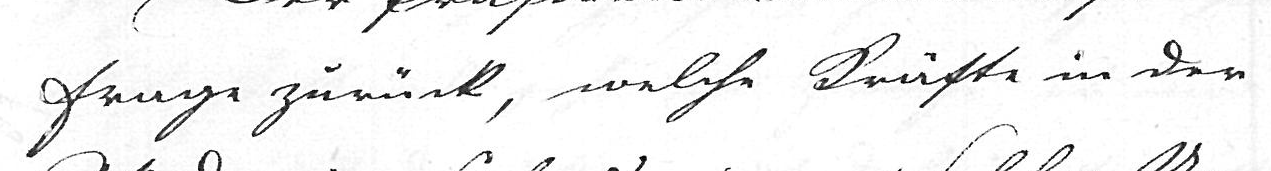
Frage zurück, welche Kräfte in der
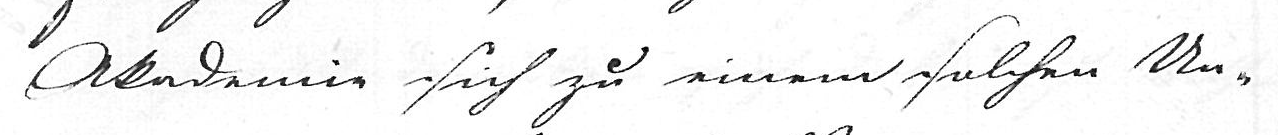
Akademie sich zu einem solchen Un-
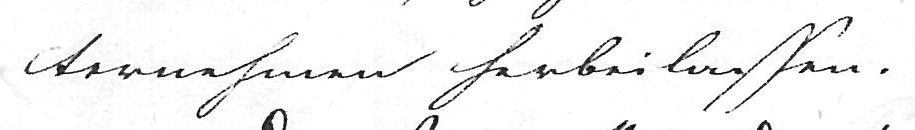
ternehmen herbeilassen.
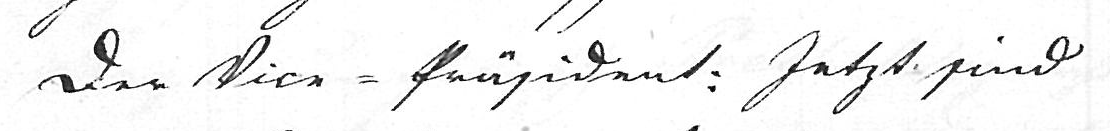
Der Vice-Präsident: Jetzt sind
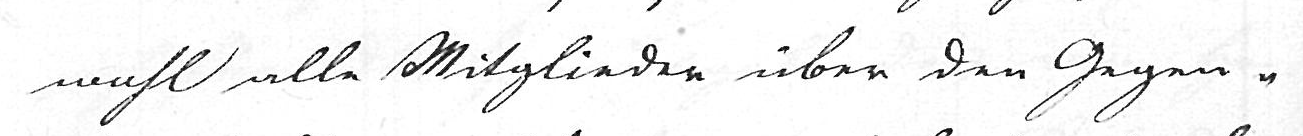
wohl alle Mitglieder über den Gegen-
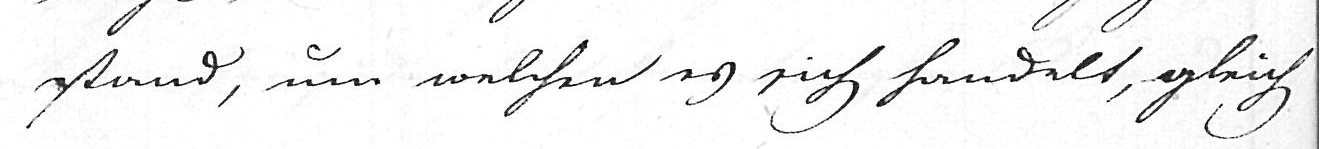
stand, um welchen es sich handelt, gleich
